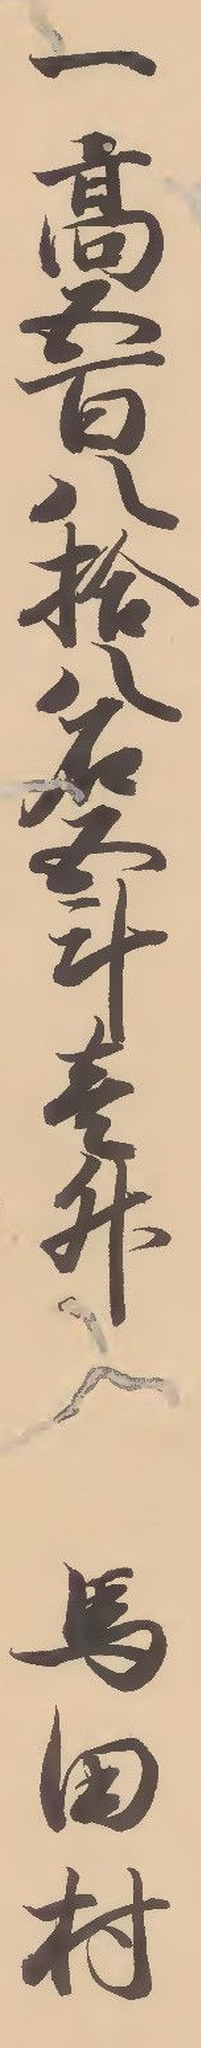一高五百八拾八石五斗壱升馬田村

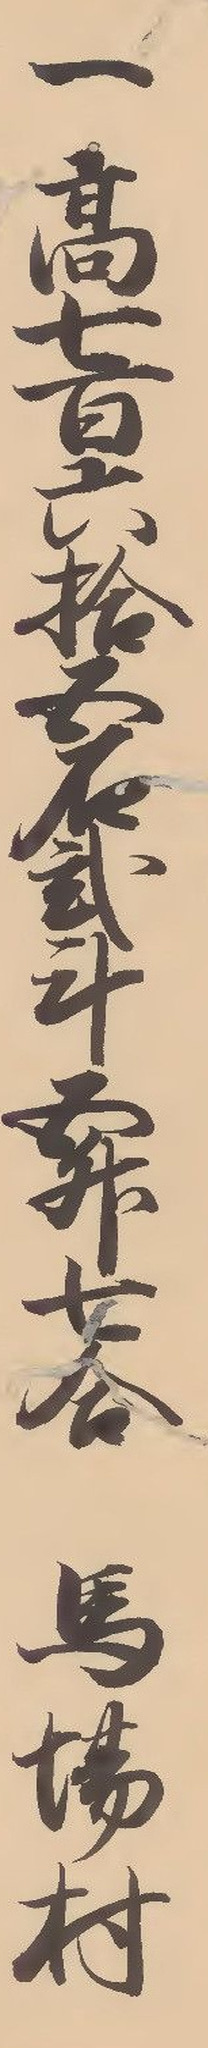一高七百六拾五石弐斗五升七合馬場村
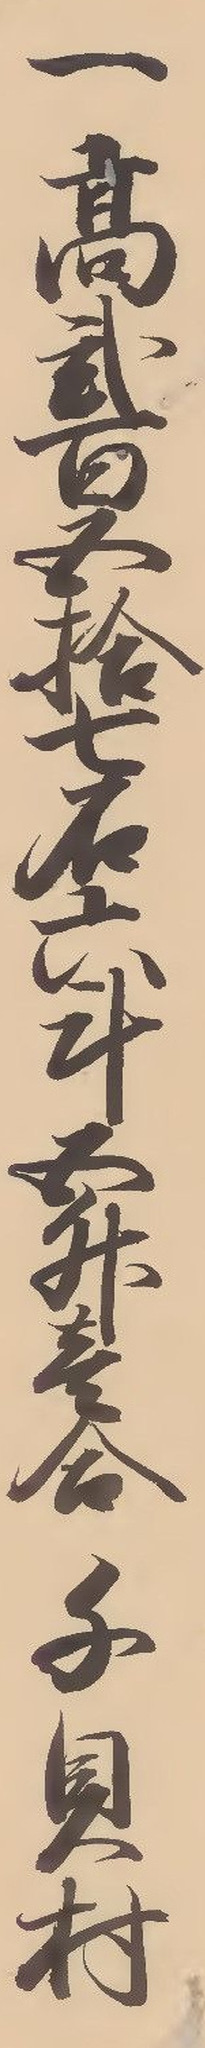一高弐百五拾七石六斗五升壱合千貝村
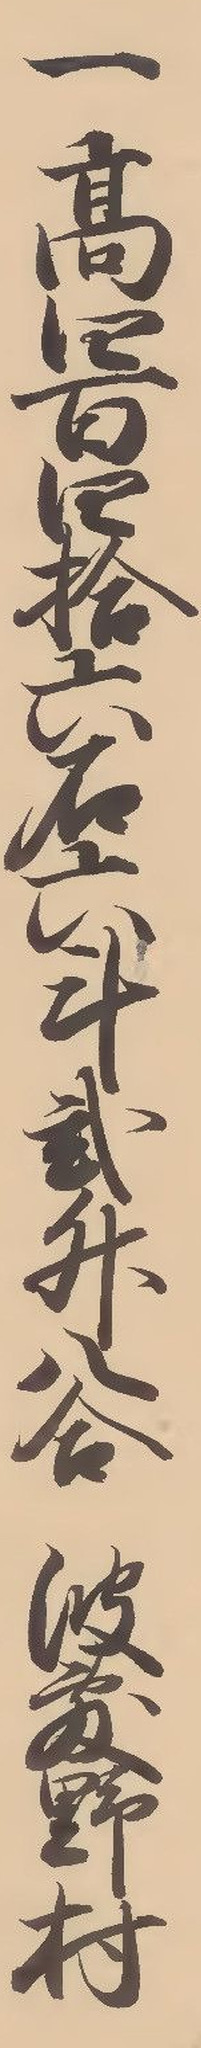一高四百四拾六石六斗弐升八合波敷野村
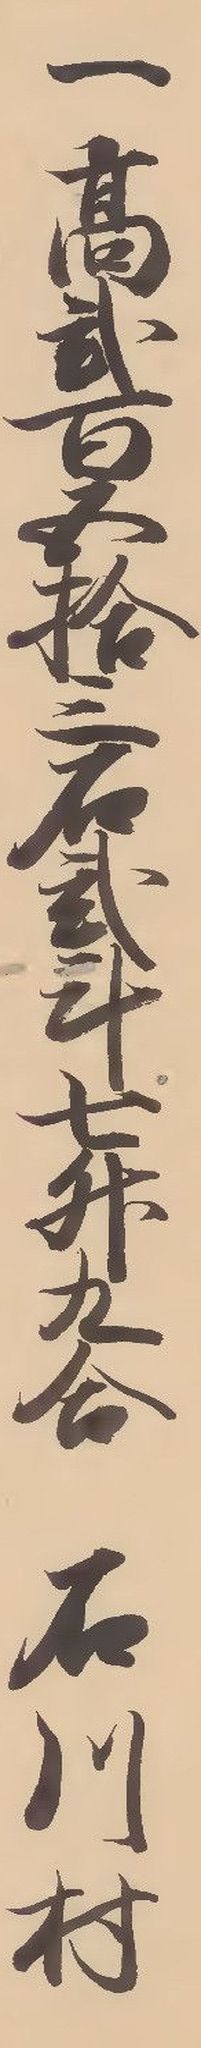一高弐百五拾三石弐斗七升九合石川村
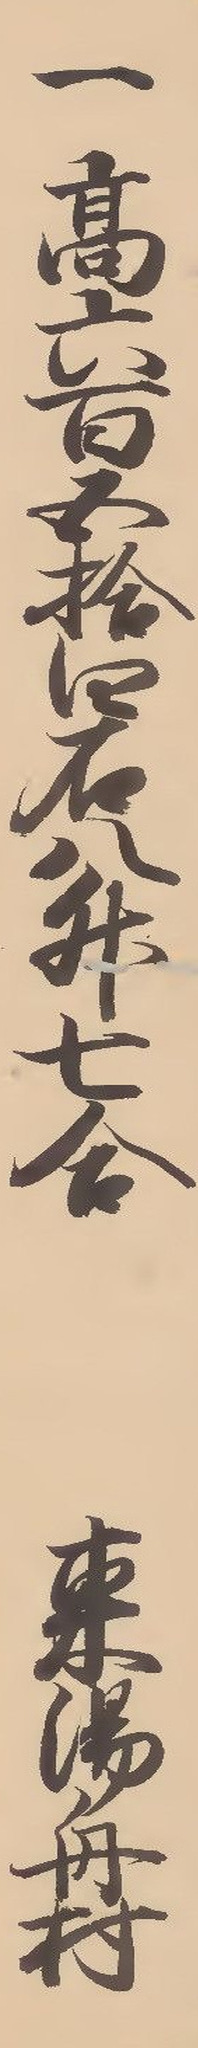一高六百五拾四石八升七合東湯舟村
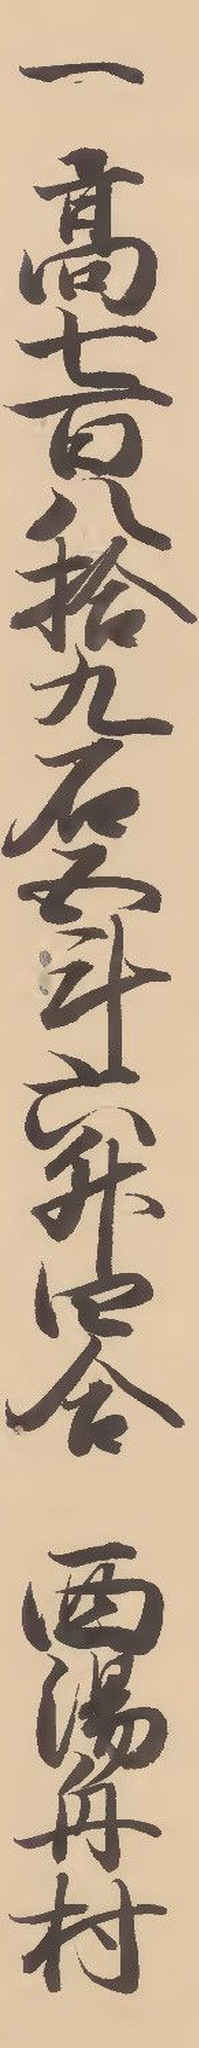一高七百八拾九石五斗六升四合西湯舟村
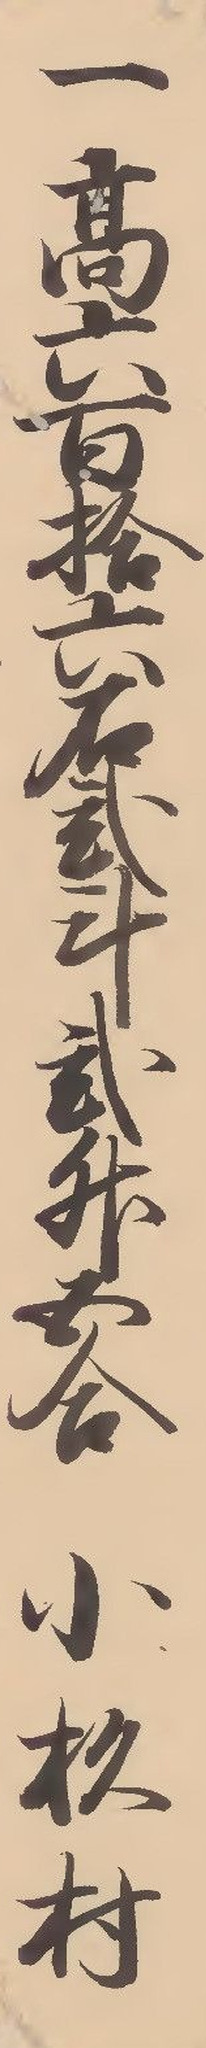一高六百拾六石弐斗弐升五合小杉村
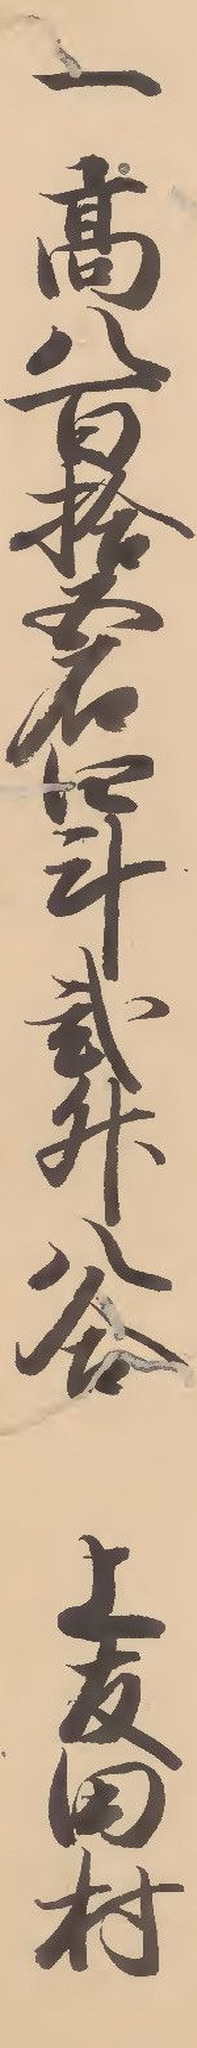一高八百拾五石四斗弐升八合上友田村

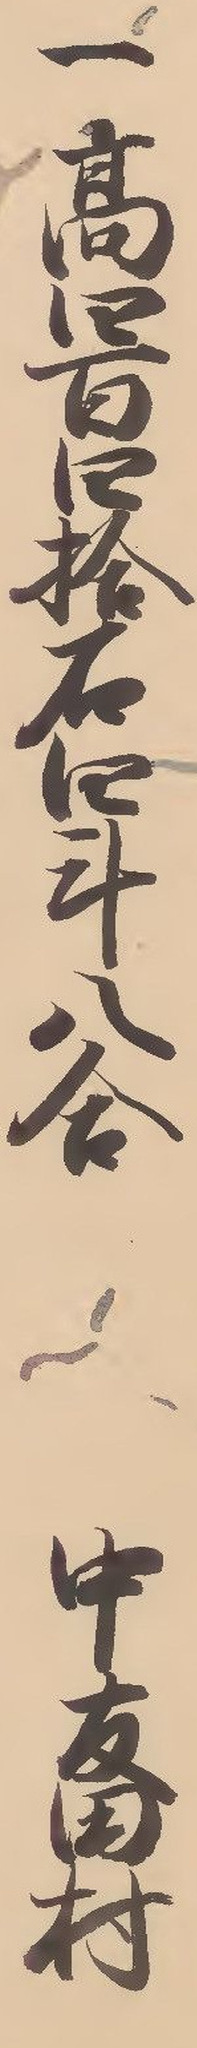一高四百四拾石四斗八合中友田村
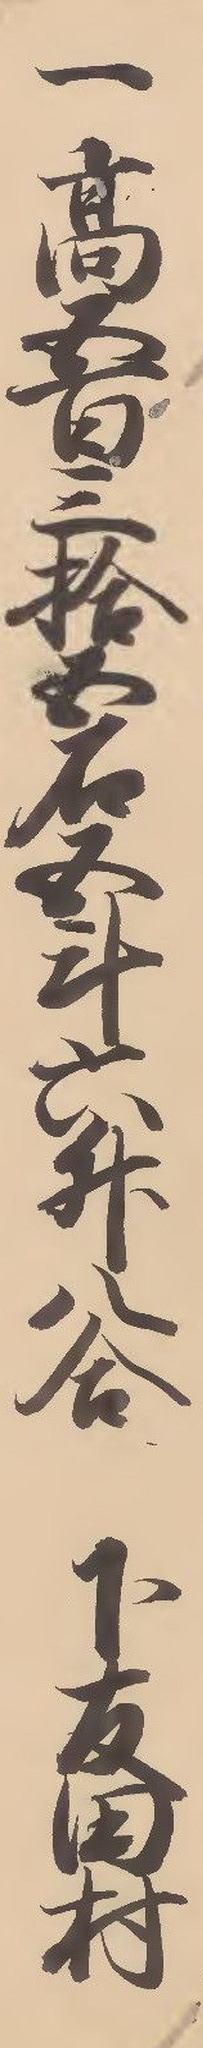一高五百三拾五石五斗六升八合下友田村
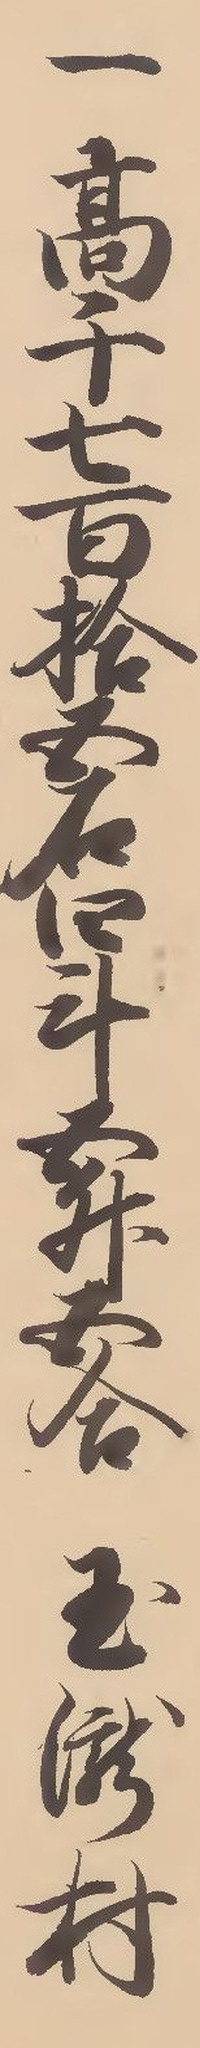一高千七百拾五石四斗五升五合玉滝村
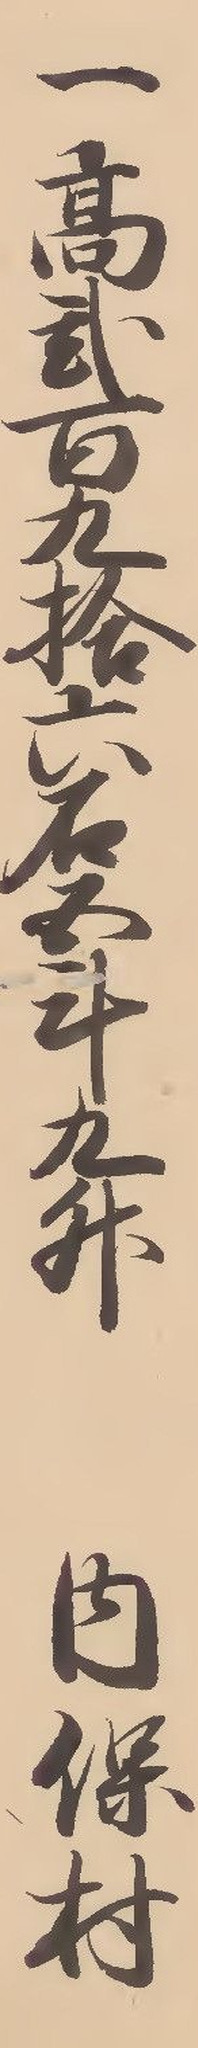一高弐百九拾六石五斗九升内保村
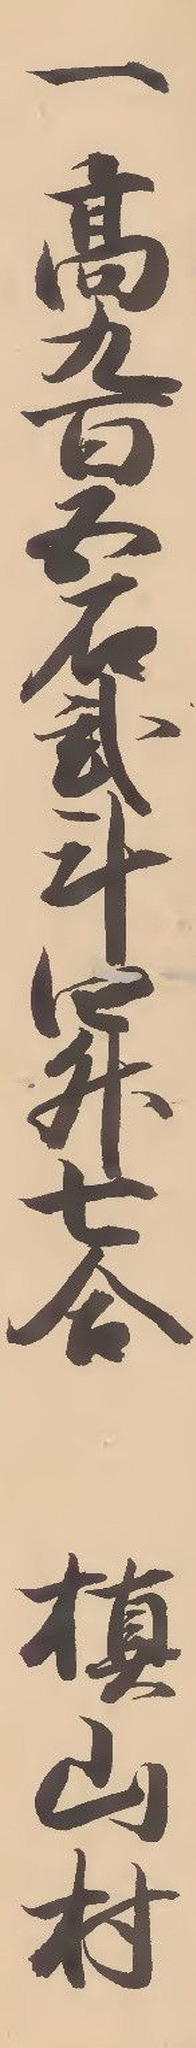一高九百五石弐斗四升七合槙山村
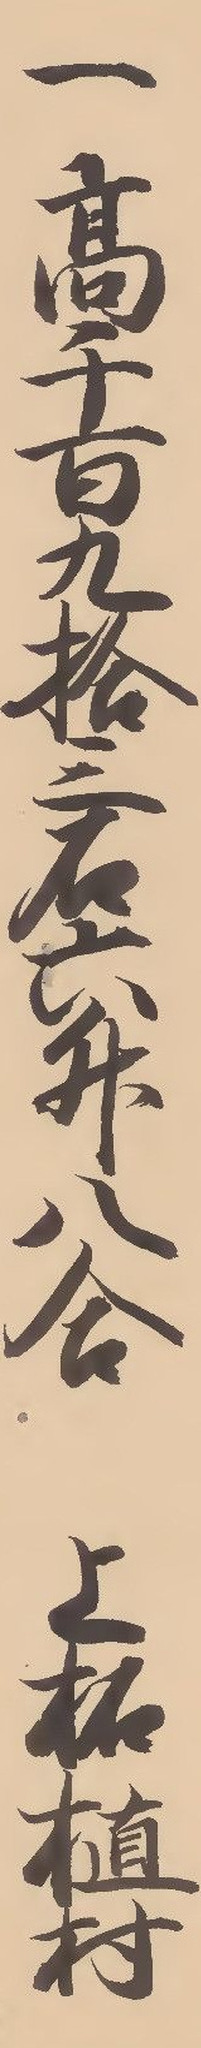一高千百九拾三石六升八合上柘植村
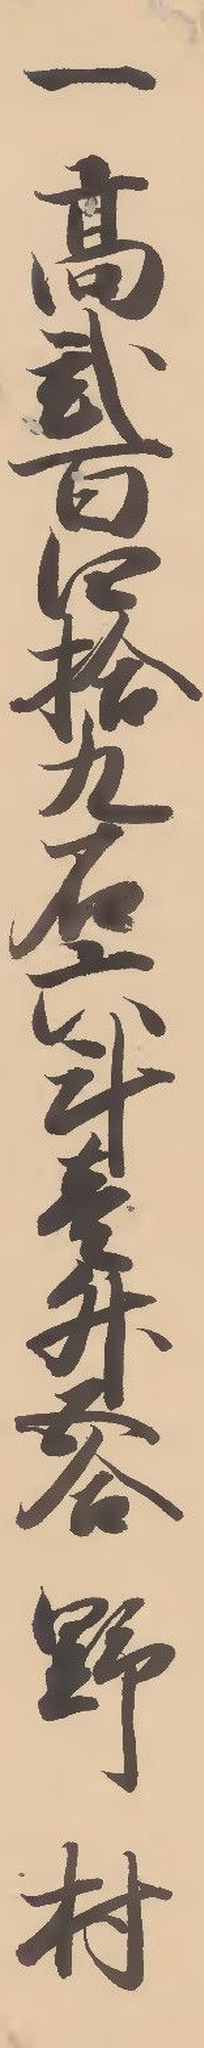一高弐百四拾九石六斗壱升五合野村
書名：伊賀国郷帳
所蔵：国立公文書館 National Archives of Japan
